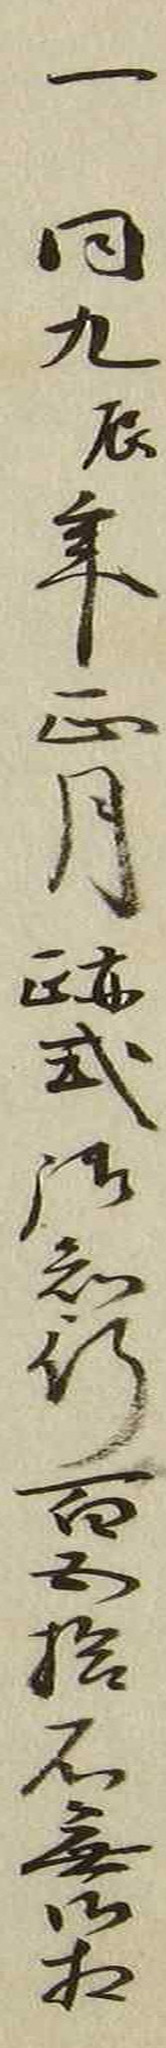一同九辰年正月跡式御知行百五拾石御相違無く
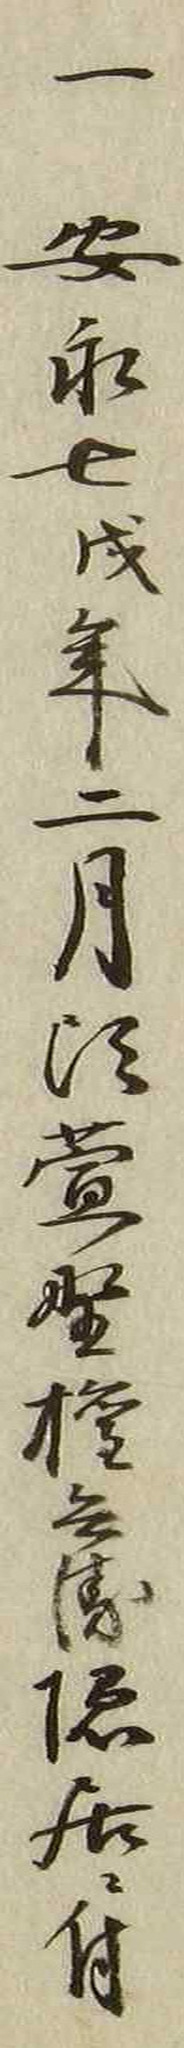一安永七戌年二月頃萱野権兵衛隠居ニ付き
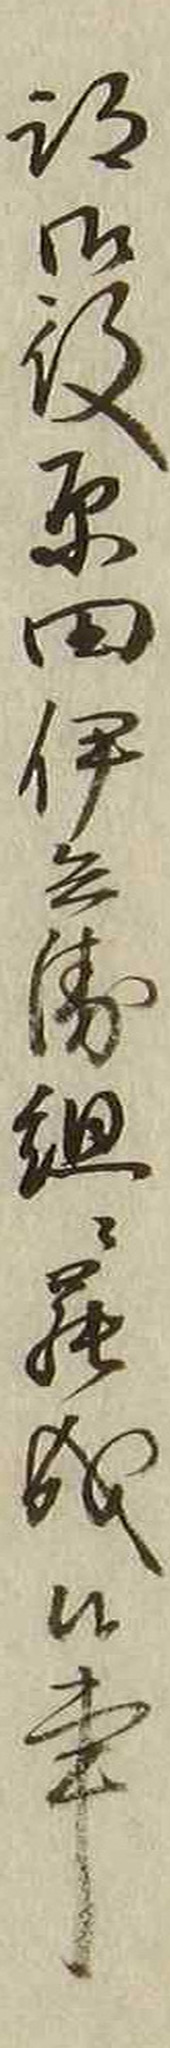群御役原田伊兵衛組ニ罷り成り候事
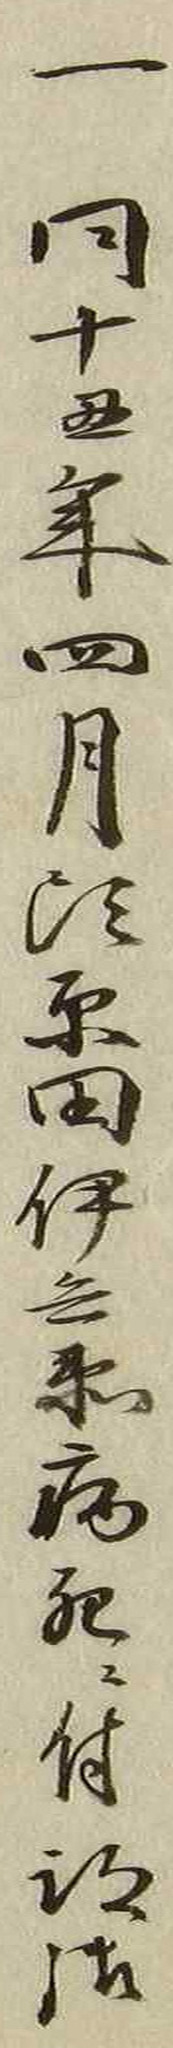一同十丑年四月頃原田伊兵衛病死ニ付き群御
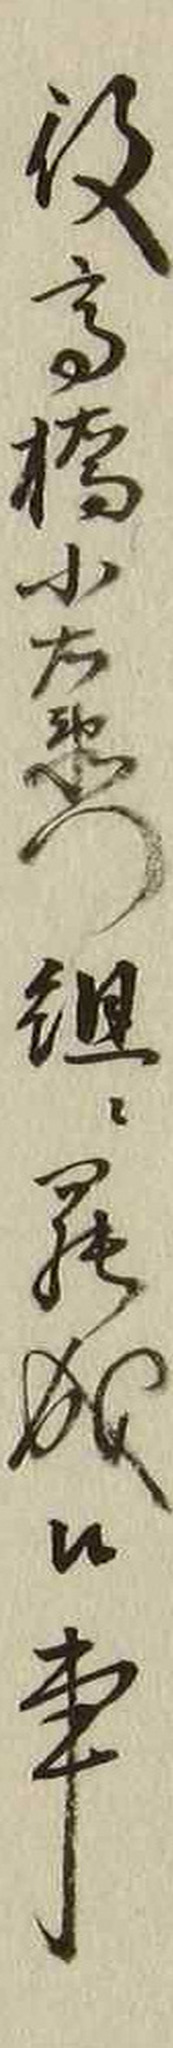役高橋小右衛門罷りなり成り候事
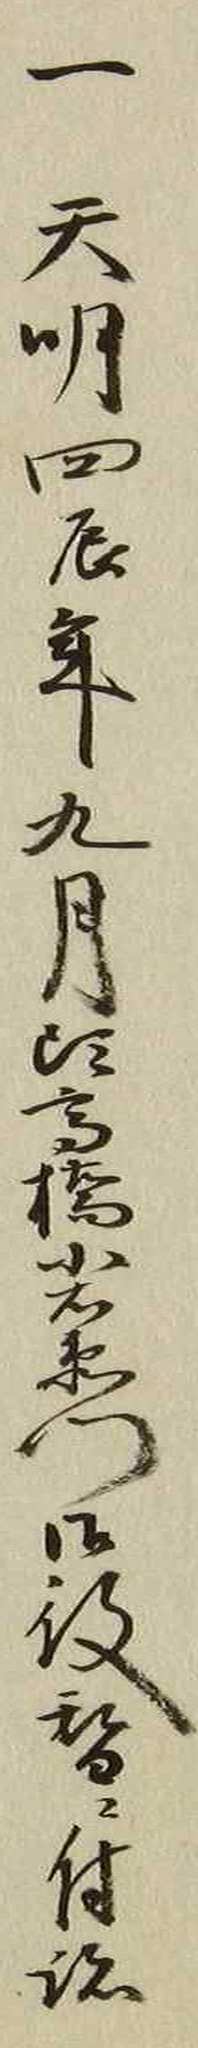一天明四辰年九月頃高橋小右衛門御役替えニ付き諸
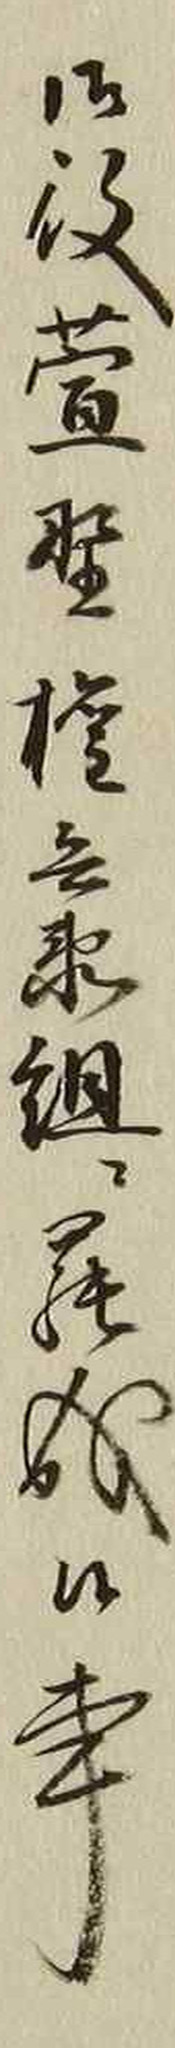御役萱野権兵衛組ニ罷り成り候事
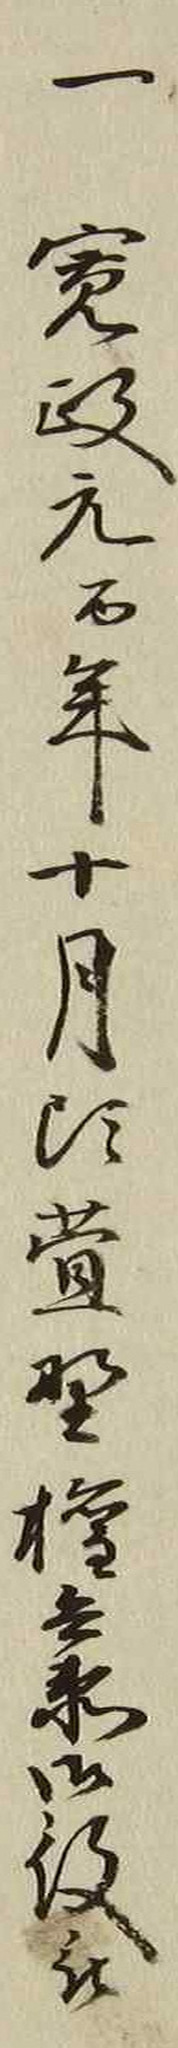一寛政元酉年十月頃萱野権兵衛御役
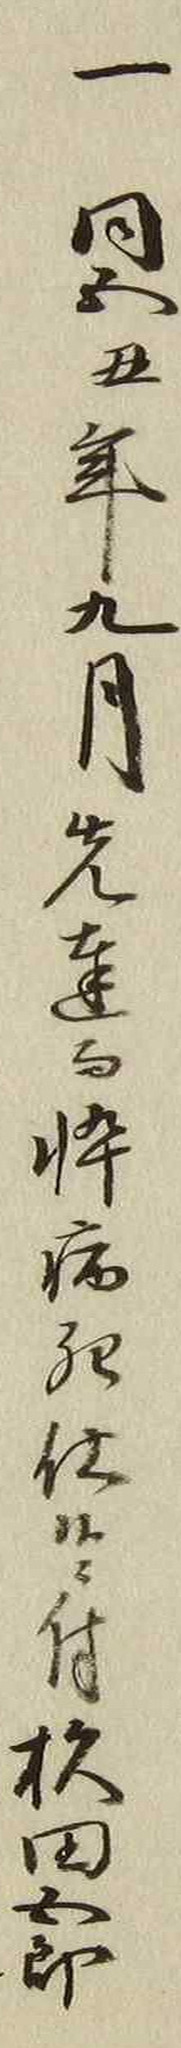一同五丑年九月先達て倅病死仕り候ニ付き杉田五郎
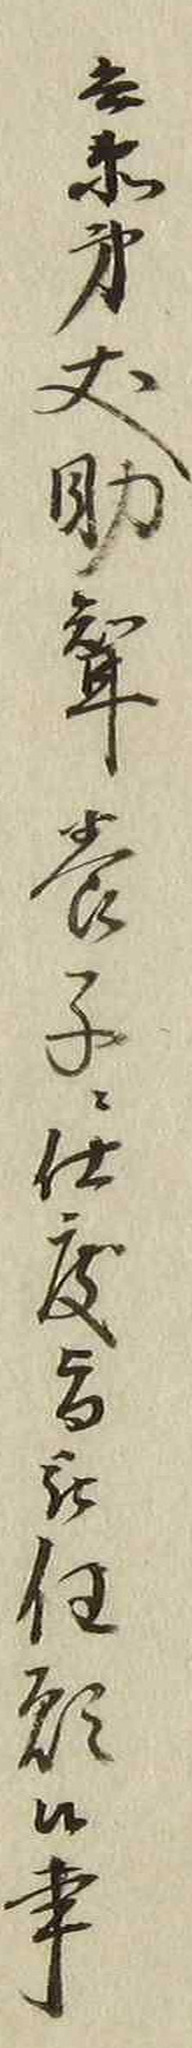兵衛弟丈助婿養子ニ仕り度旨任せ願われ候事
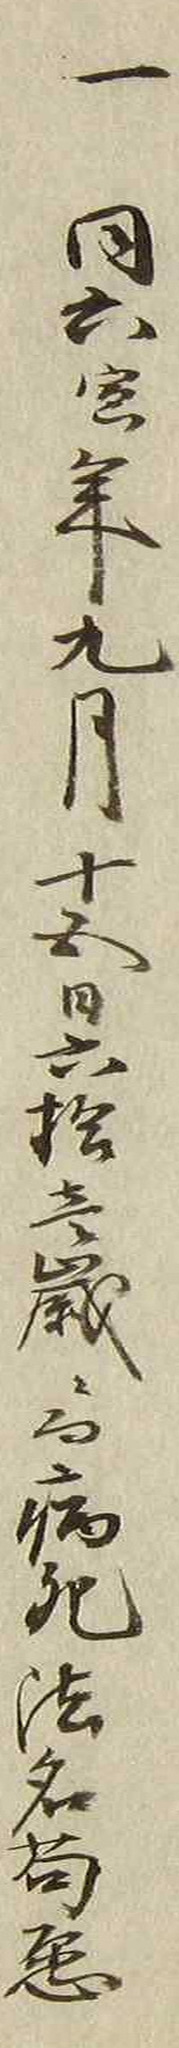一同六寅年九月十五日六拾壱歳ニて病死法名苟愿
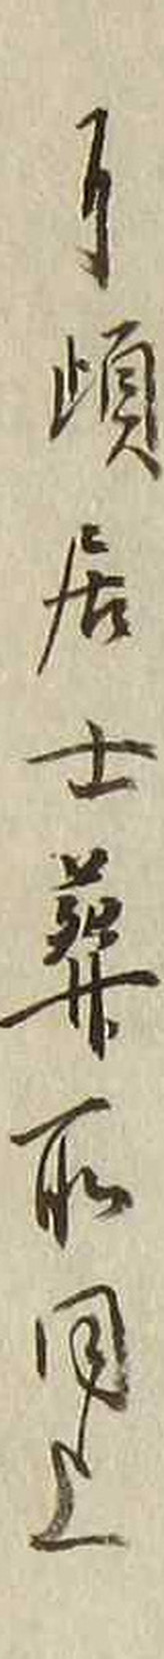了頻居士葬所同上

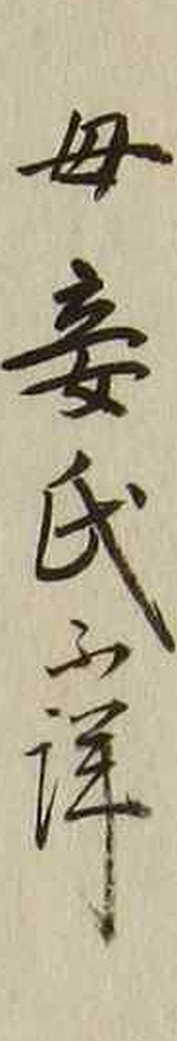母妾氏不詳
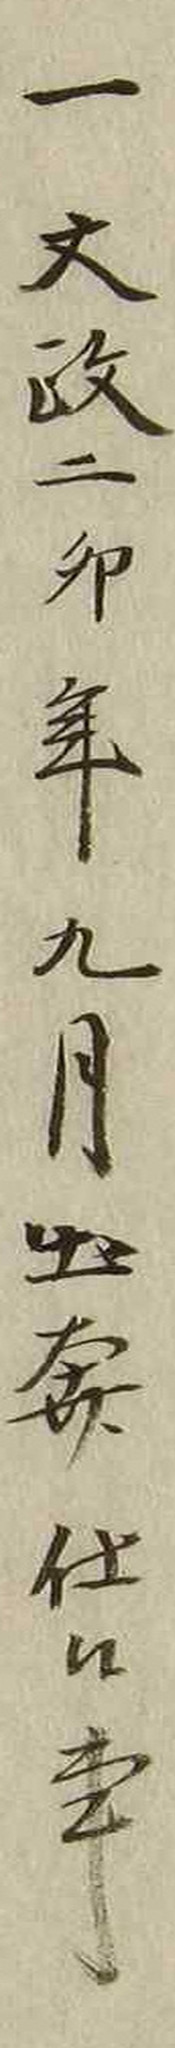一文政二卯年九月出奔仕り候事
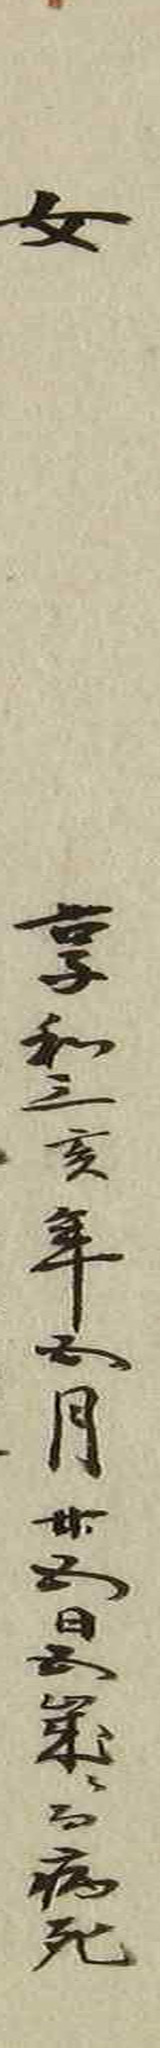享和三亥年五月廿五日五歳ニて病死
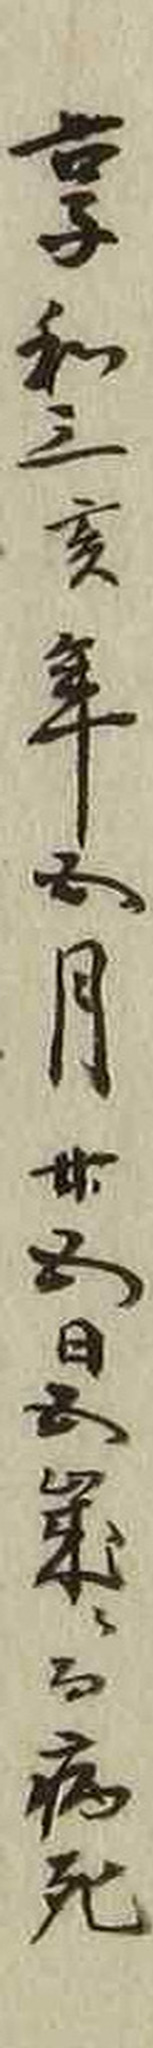享和三亥年五月廿五日五歳ニて病死
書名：諸士系譜　巻之19　い之部19
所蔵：会津若松市立会津図書館
